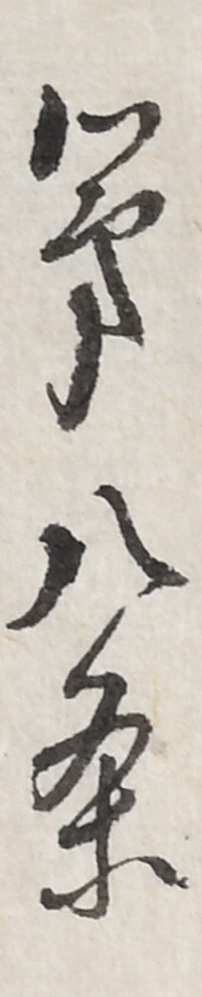第八条
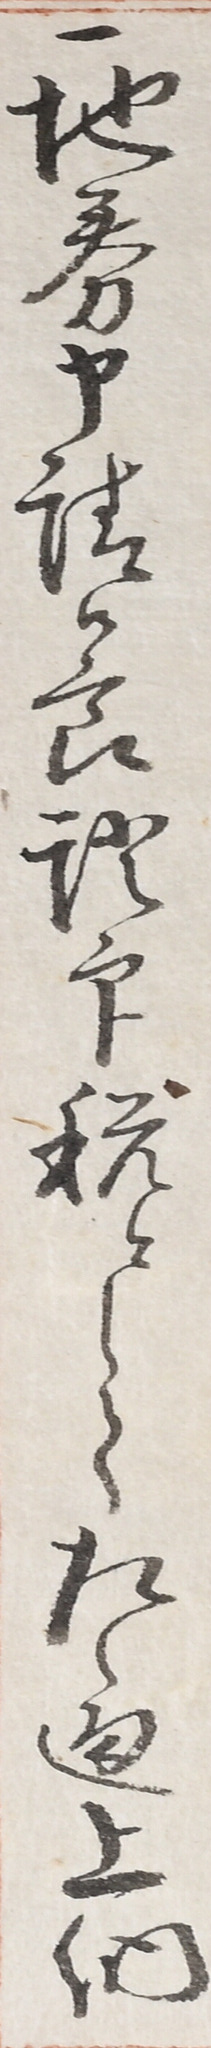一地券申請候節証印税として左之通上納
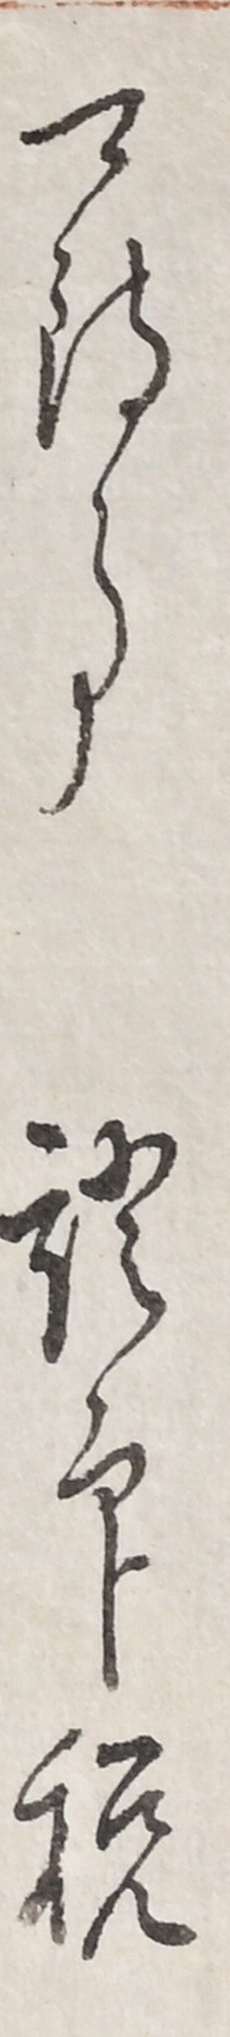可致事証印税
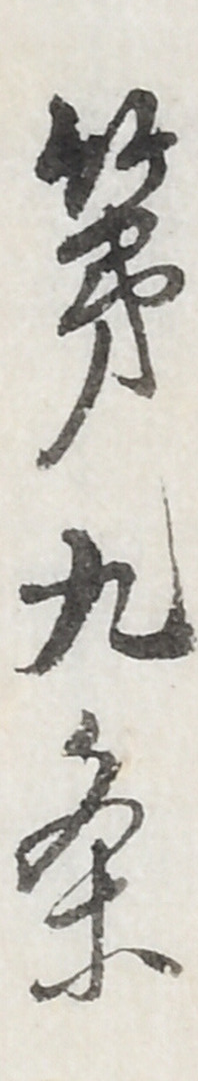第九条
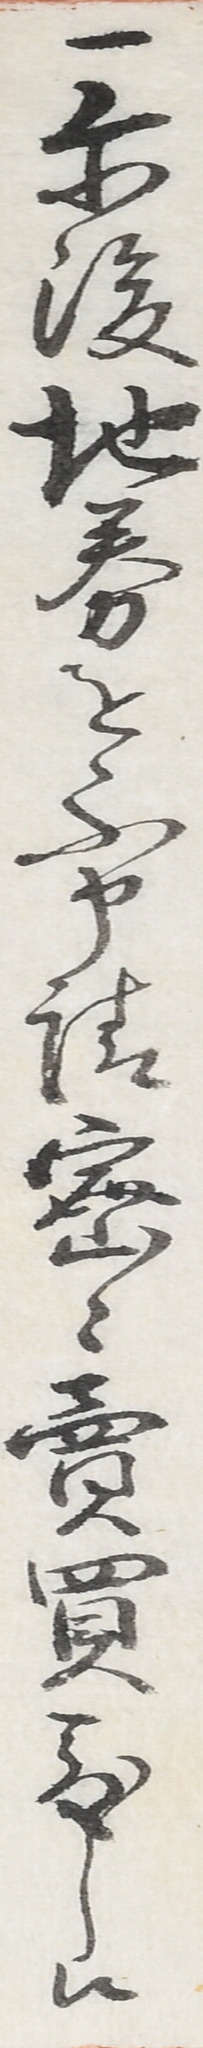一爾後地券を不申請密ニ売買致し候
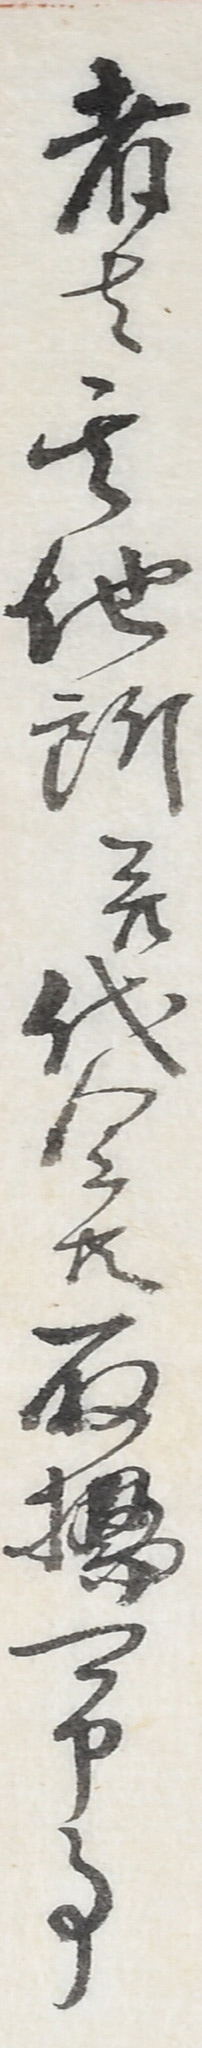者は其地所幷代金共取揚可申事
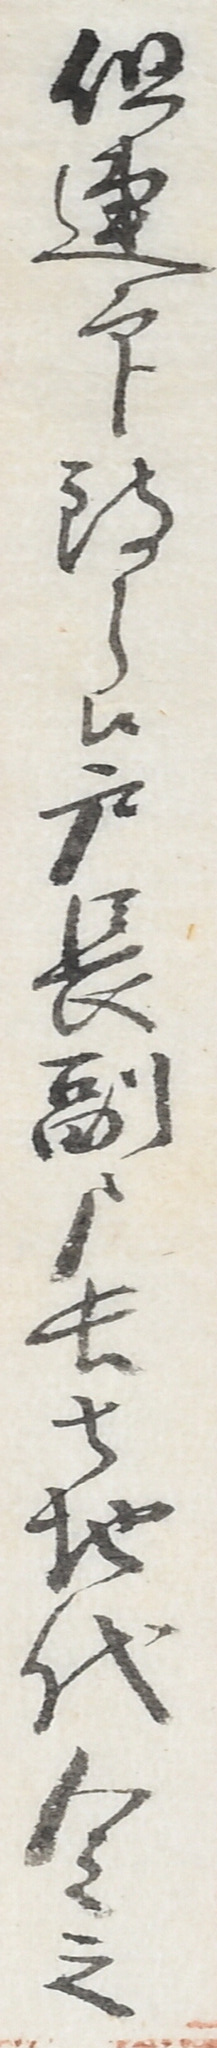但連印致し候戸長副戸長は地代金之
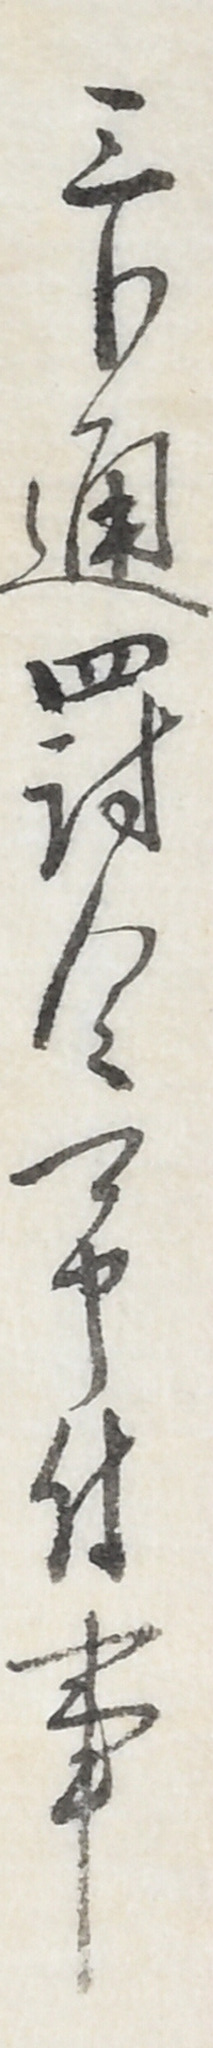三分通罰金可申付事

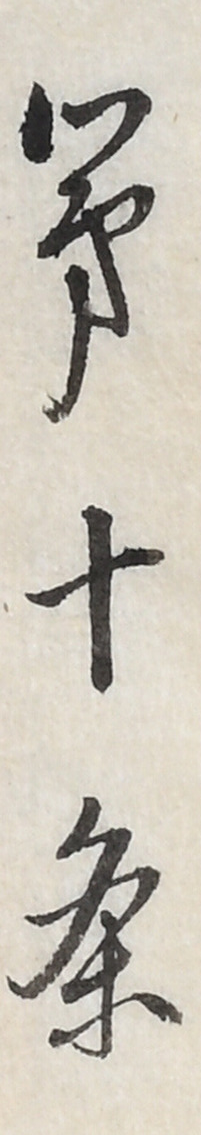第十条
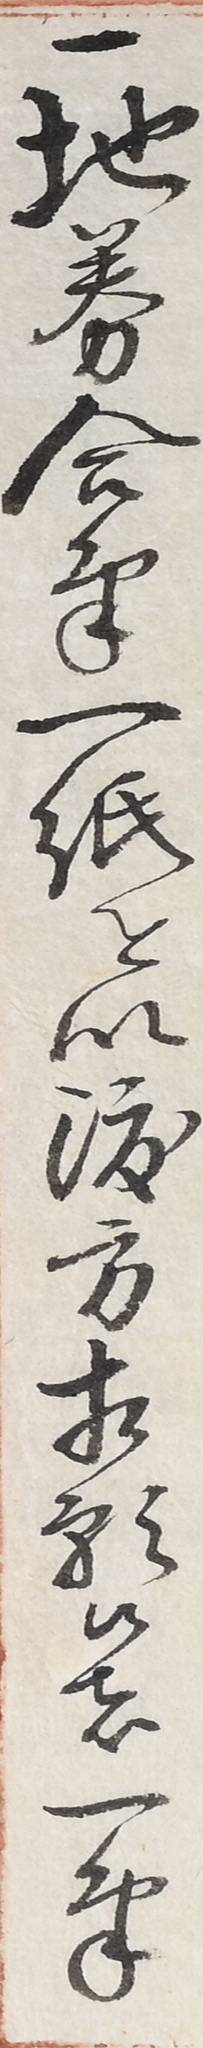一地券合筆一紙を以渡方相願候は一筆
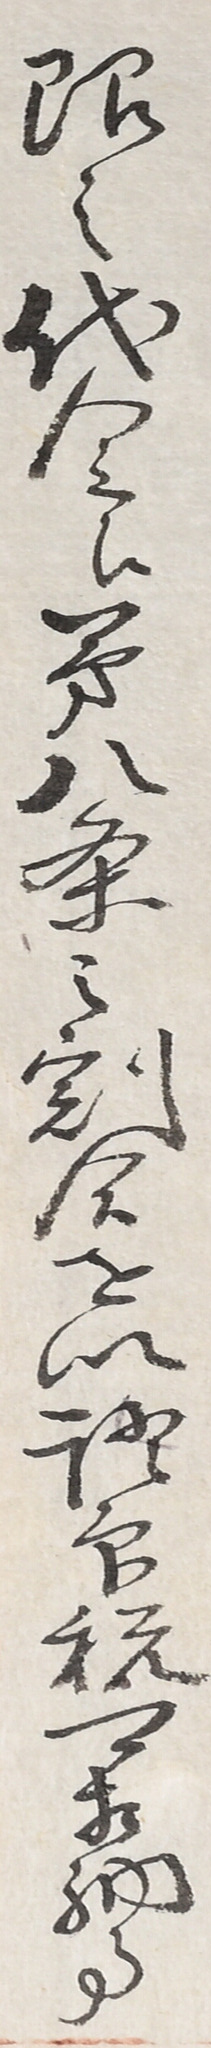限之代金え第八条之割合を以証印税可相納事
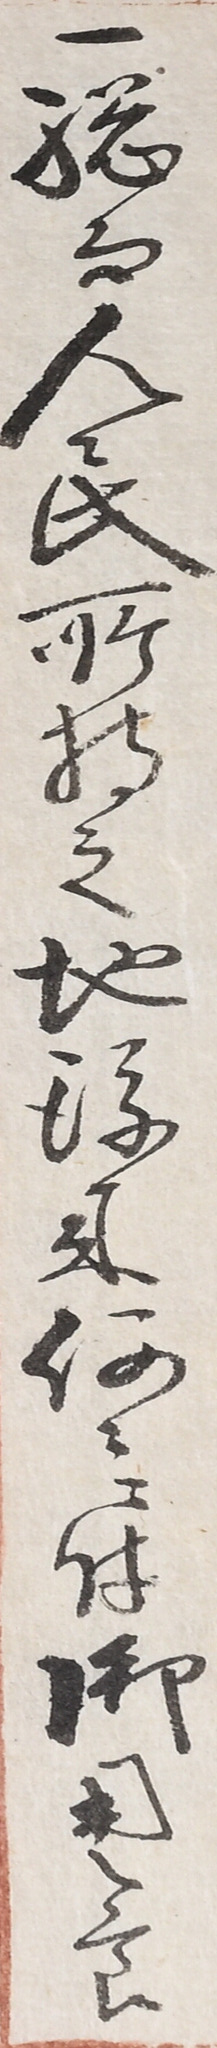一総而人民所持之地後来何ニニ付御用之節
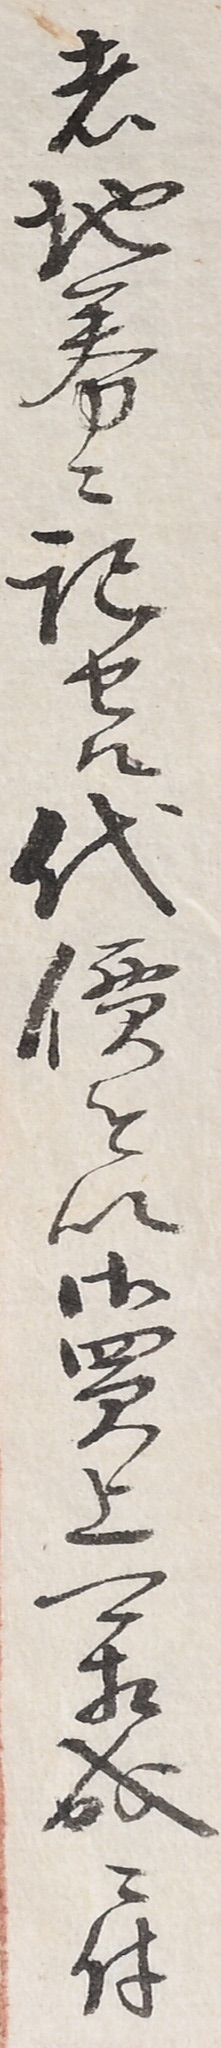は地券ニ記セル代価を以御買上可相成ニ付
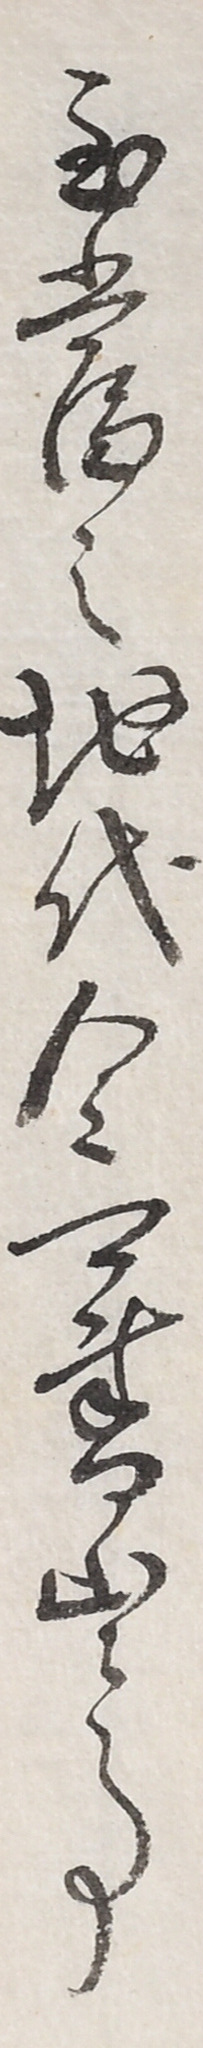至当之地代金可書出事
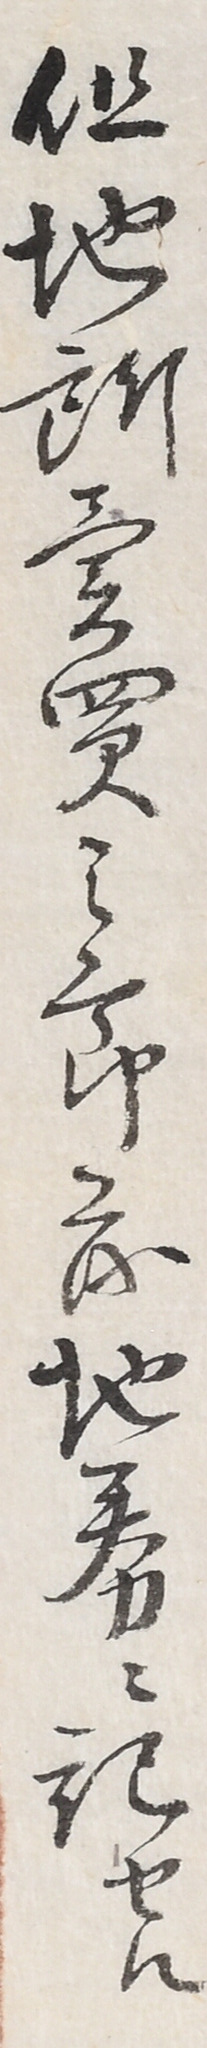但し地所売買之節も地券ニ記セル
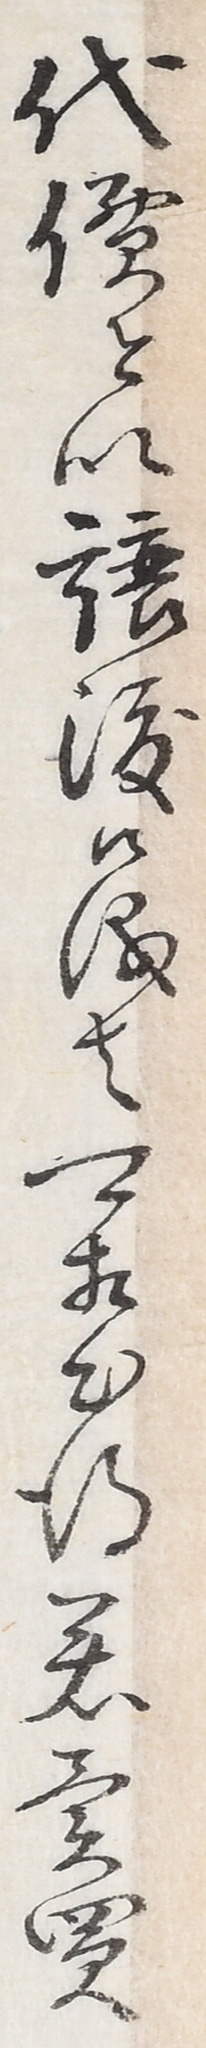代価を以譲渡候儀は可相心得若売買
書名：壹番・御布告一式
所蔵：伊那市立高遠町図書館・合同会社AMANE
